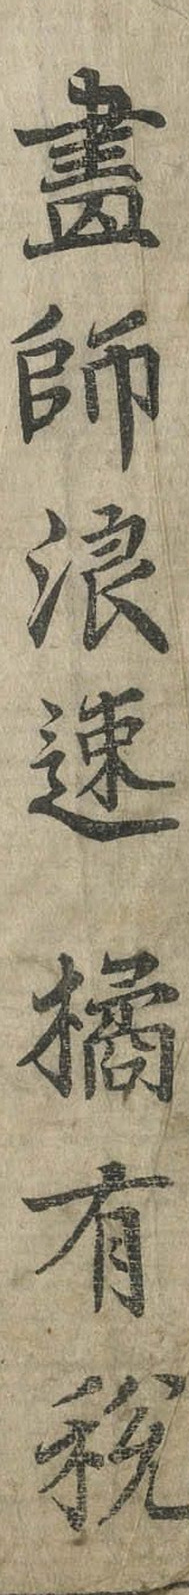画師浪速橘有税
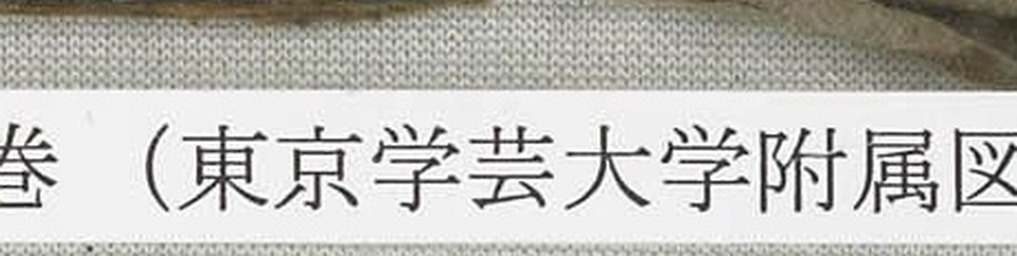東京学芸大学蔵書
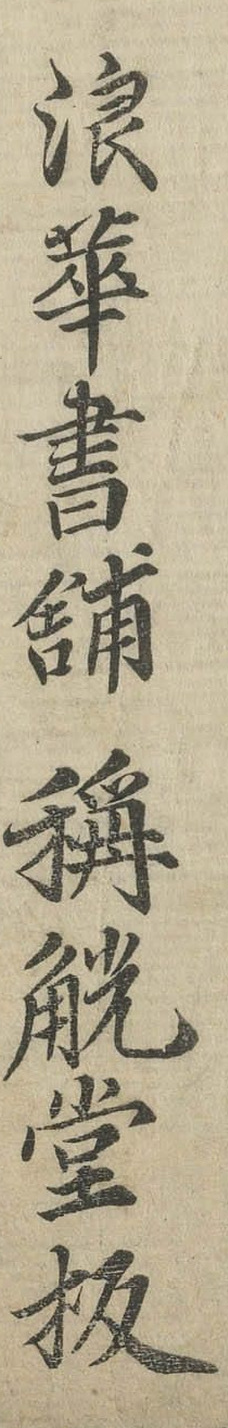浪華書舗称觥堂板

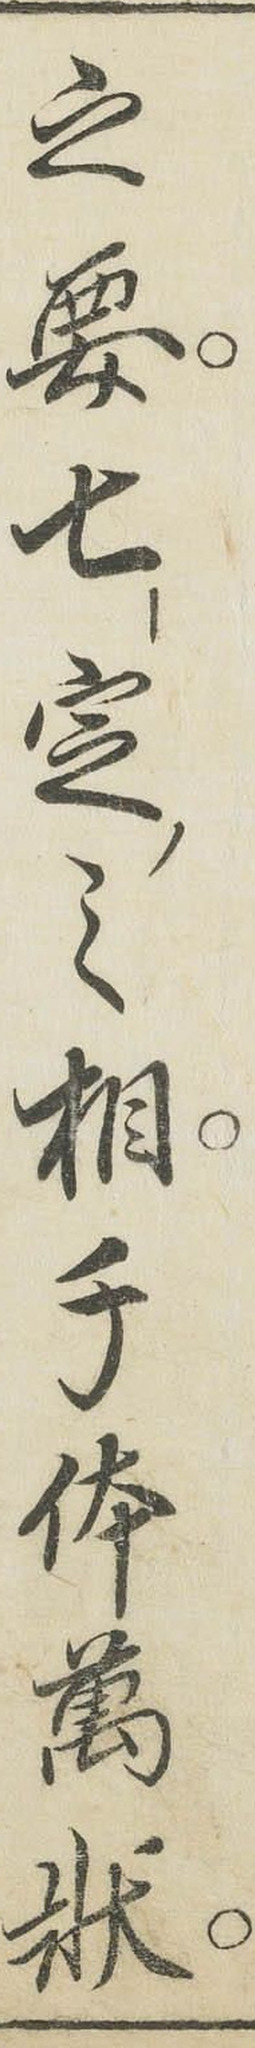之要。七-定之相。手体万状。

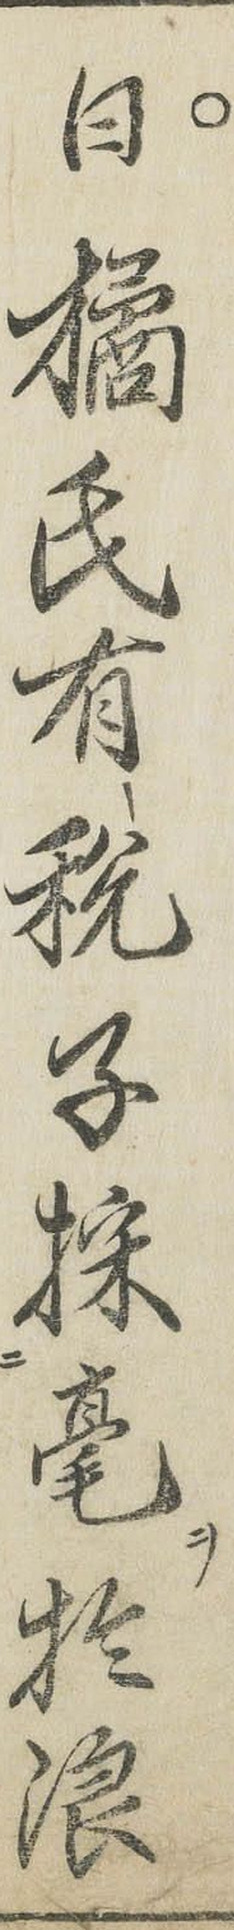日。橘氏有-税子採毫於浪
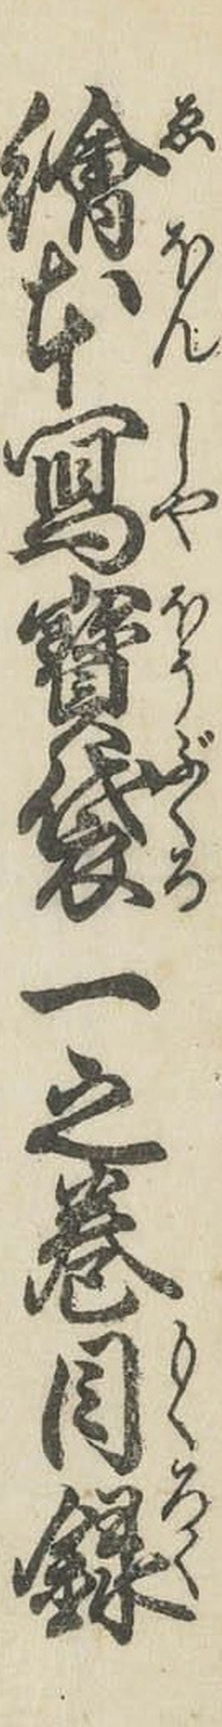絵本写宝袋一之巻目録
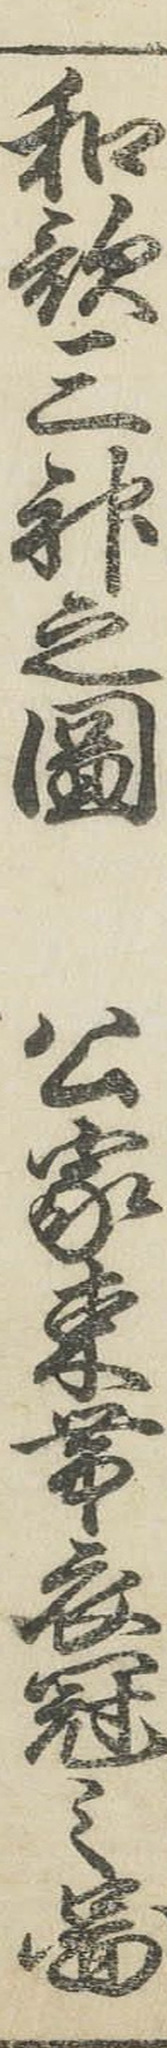和歌三神之図公家束帯衣冠之図
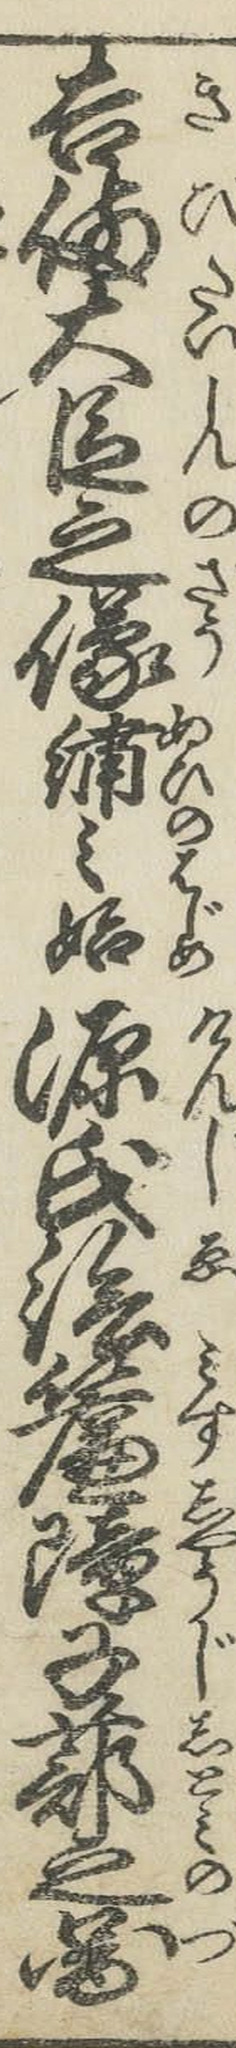吉備大臣之像縫之始源氏絵簾障子蔀之図
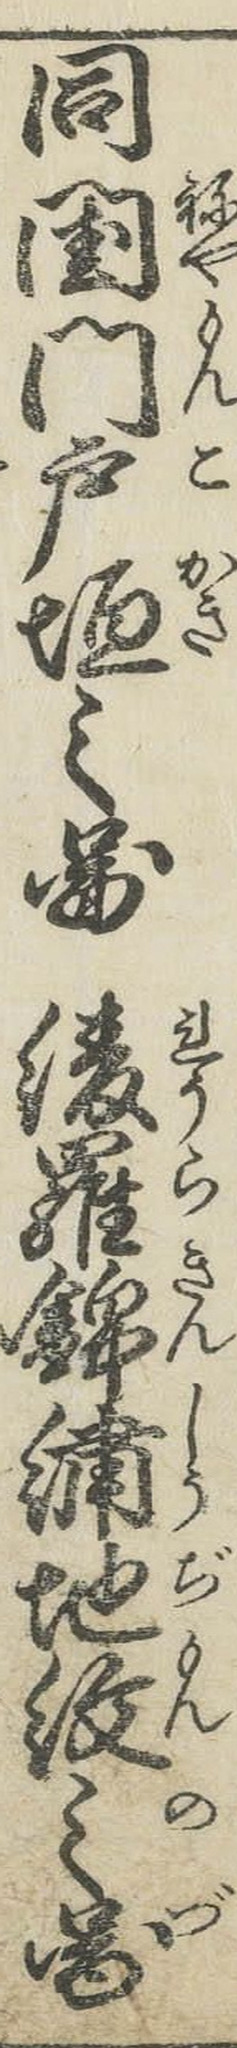同閨門戸垣之図綾羅錦繍地紋之図
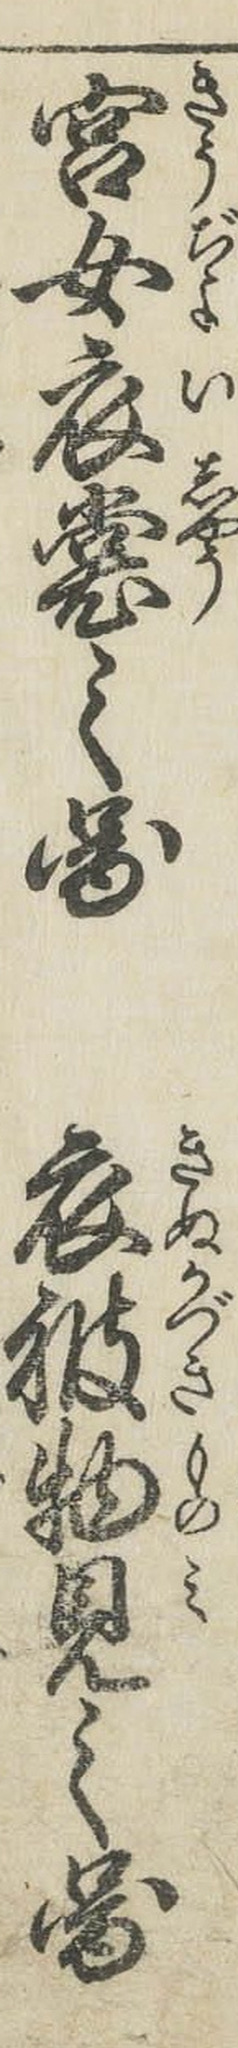宮女衣装之図衣被物見之図
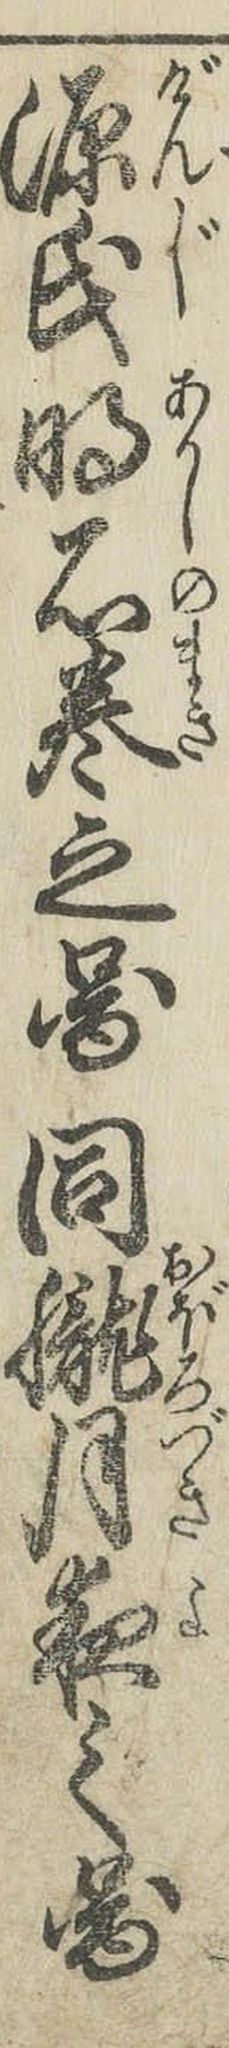源氏明石巻之図同朧月夜之図

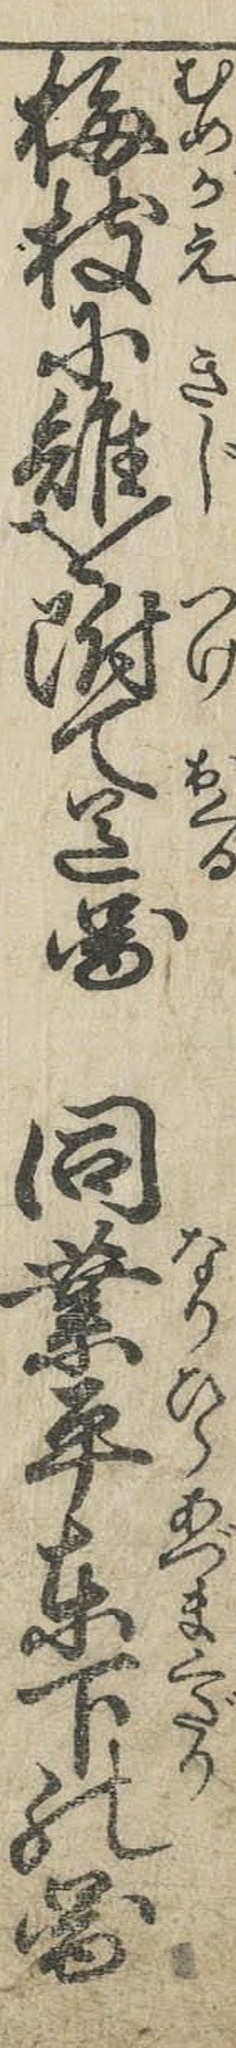梅枝に雉を附て送図同業平東下の図
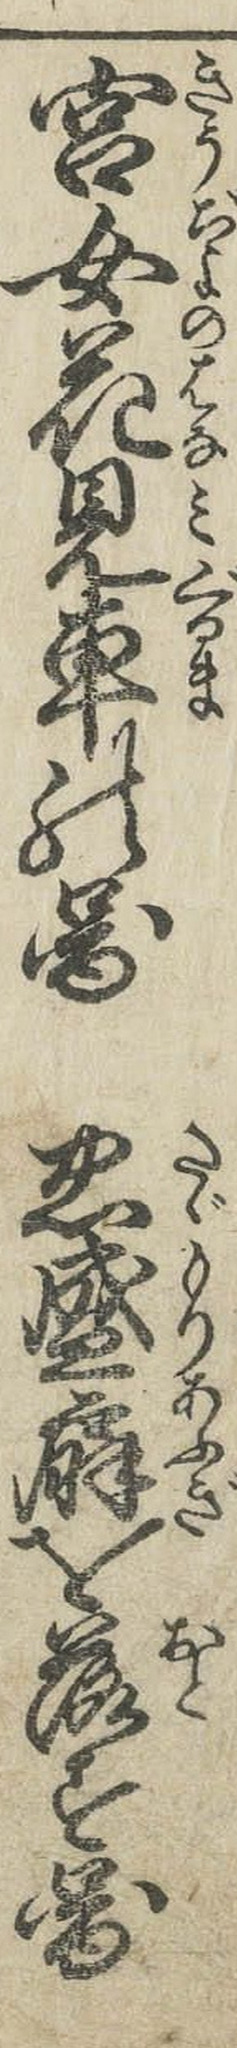宮女花見車の図忠盛扇を落す図
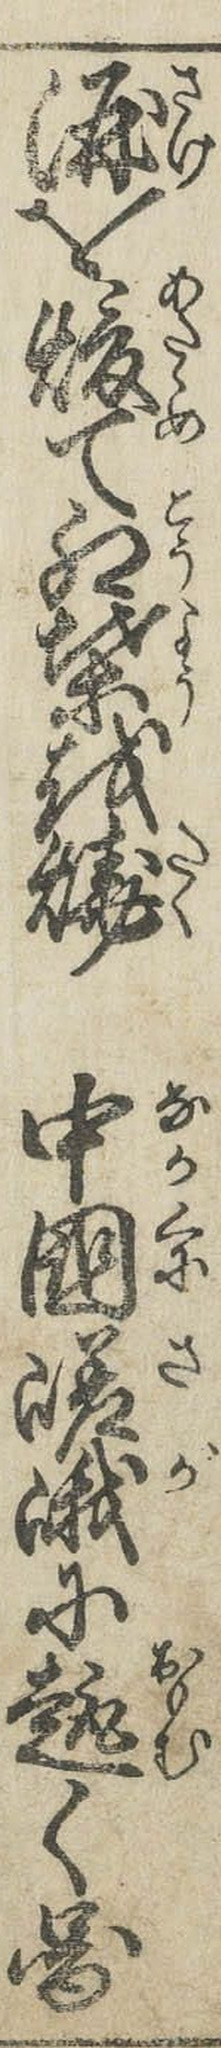酒を煖て紅葉を焼中国嵯峨に趣く図
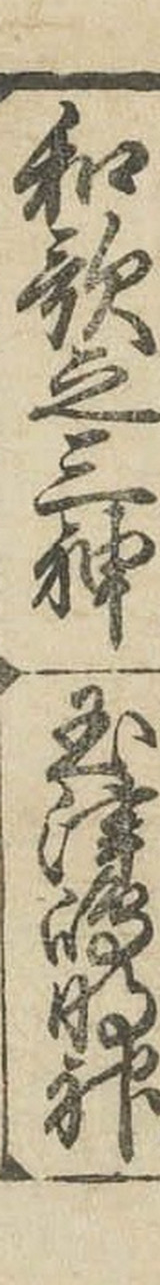和歌之三神玉津嶋明神
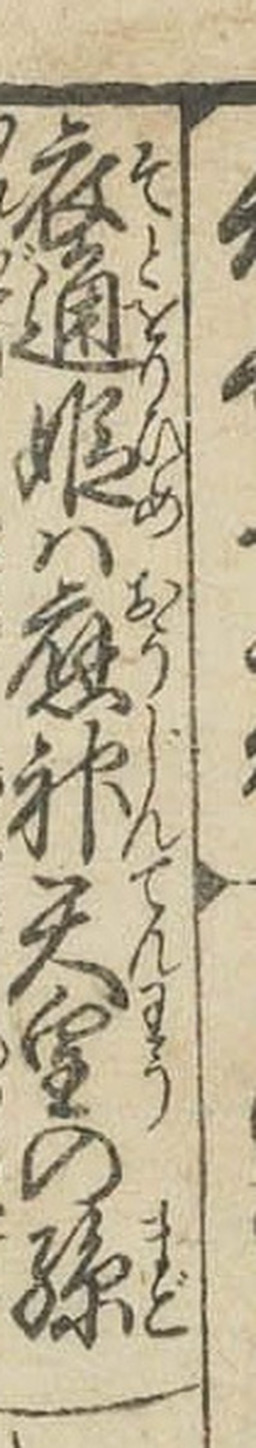衣通姫は応神天皇の孫
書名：絵本写宝袋 9巻 1之巻
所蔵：東京学芸大学教育コンテンツアーカイブ
